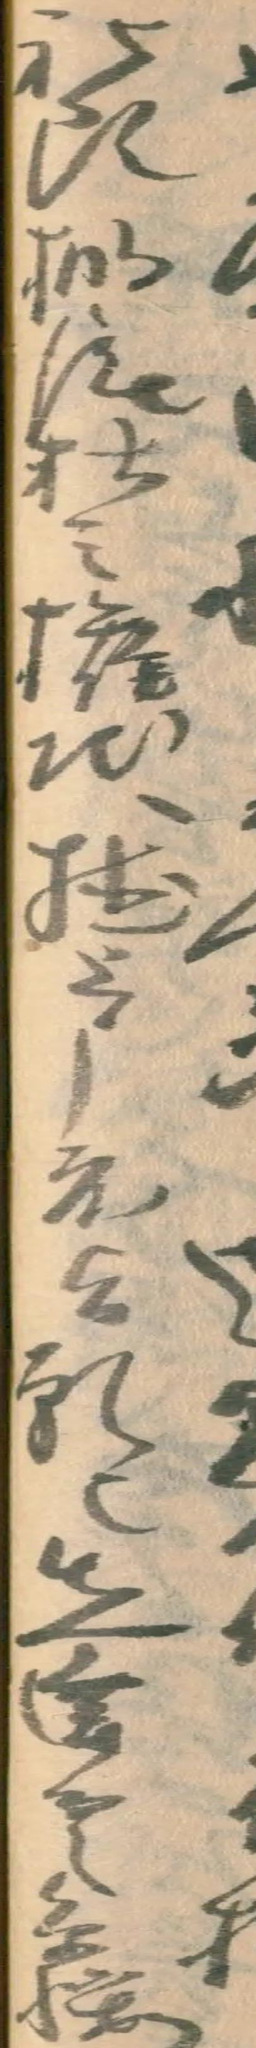社頭棚尾社之権地へ植上申度旨願也先達而之糸桜
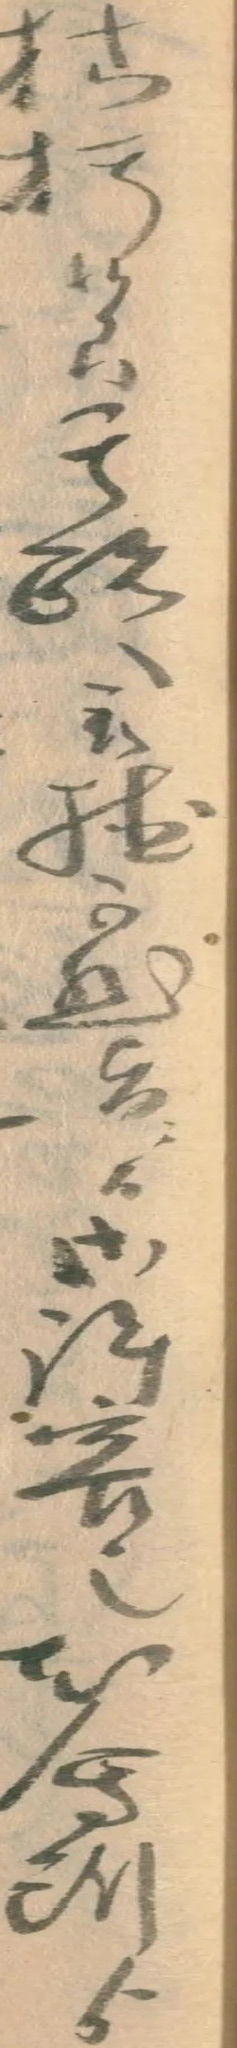枯朽候間其跡へ被植可然旨ニ而御許容也尤会所ゟ
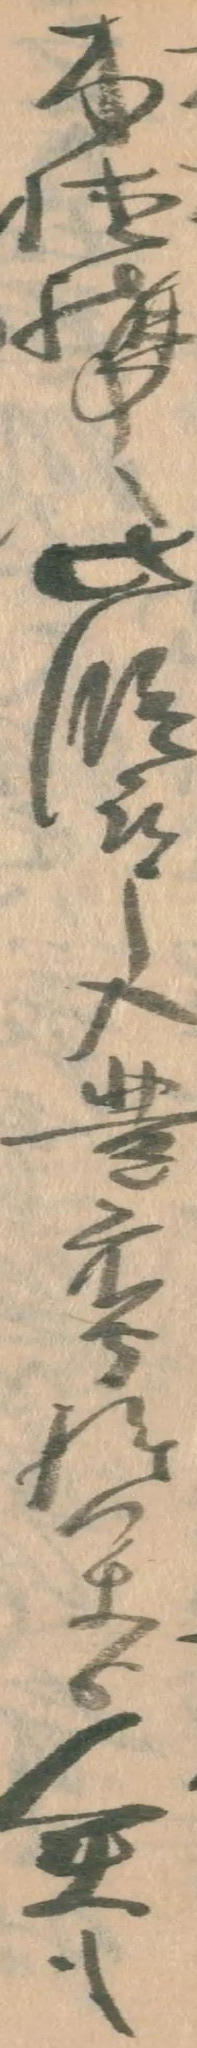木植構中へ此段被申入豊前守権大夫ゟ人夫も
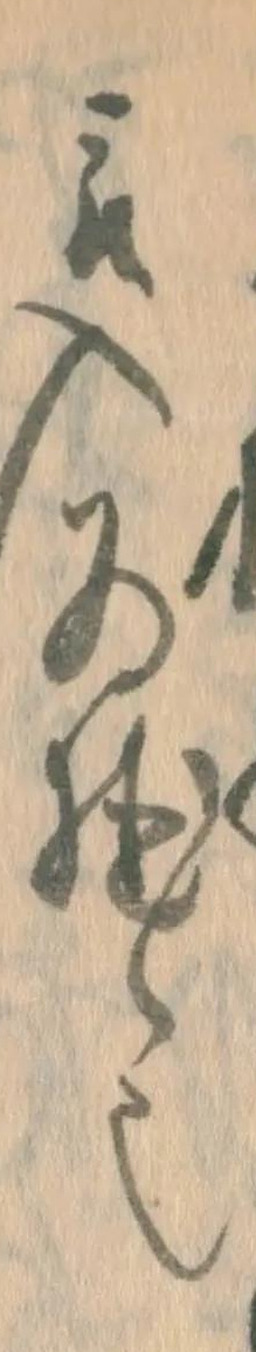被入為植候也
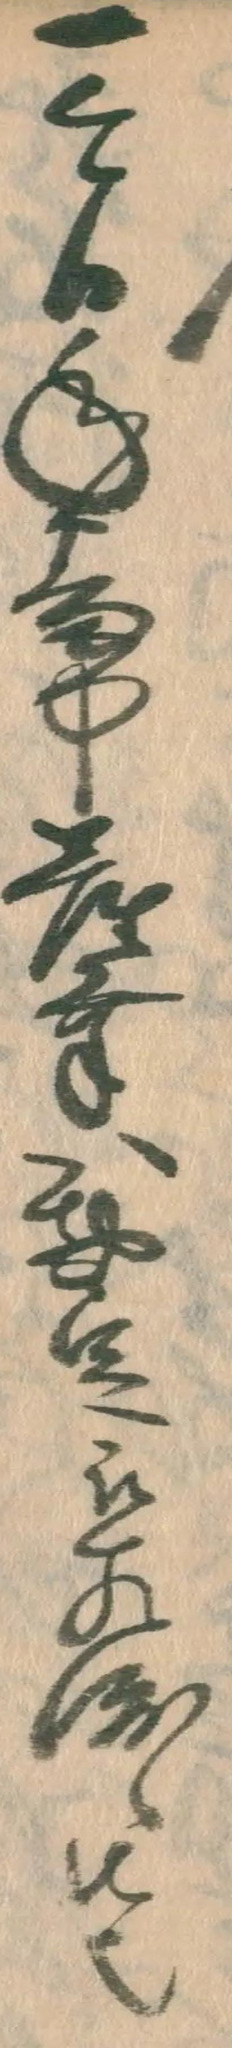一今日年番中産幸へ勘定被相渡候由也
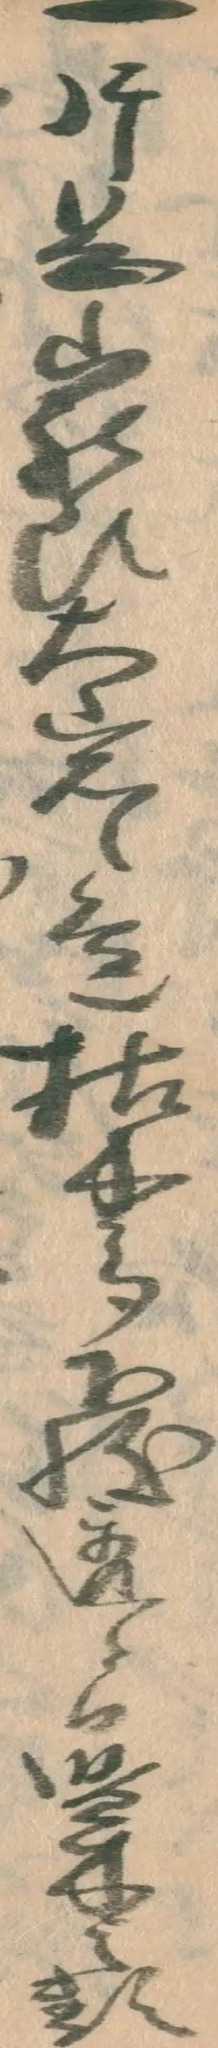一片岡山社頭大岩之辺枯木多下枝透ニ而監木之類
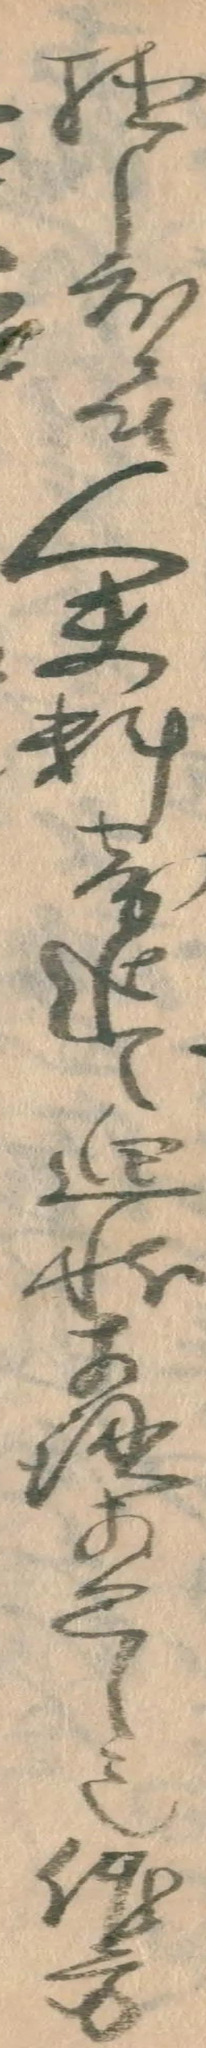植申度ニ付人夫料寄進候廻状相認相廻し候也作方
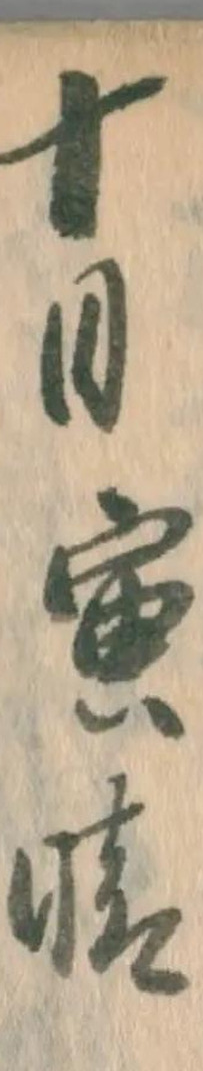十日寅晴
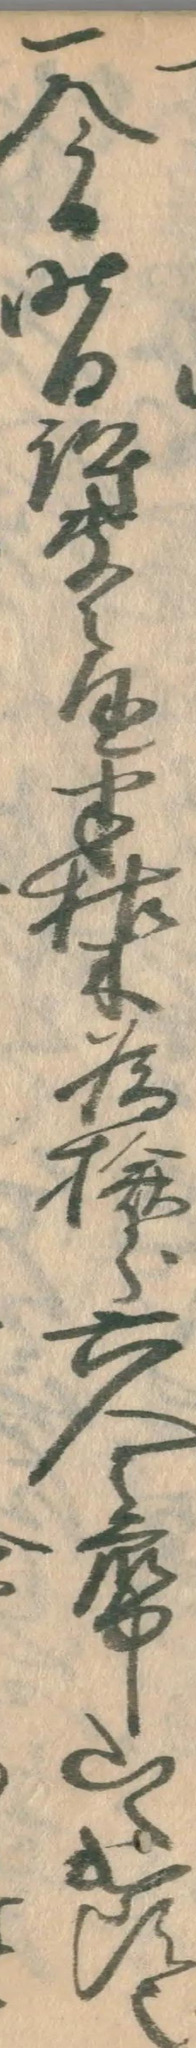一今日昨日評決之通半枯木為検分六人之衆中山へ出頭也
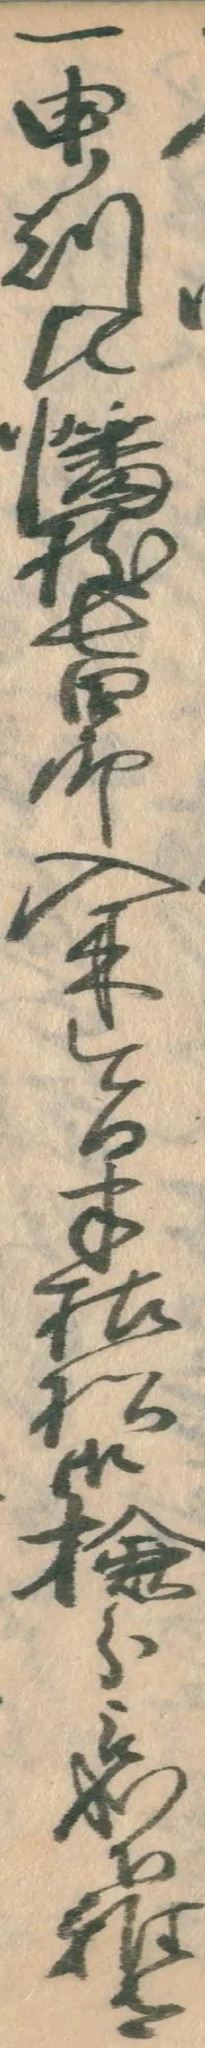一申ノ刻比幡枝長四郎入来今日半枯松御検分被成下難有
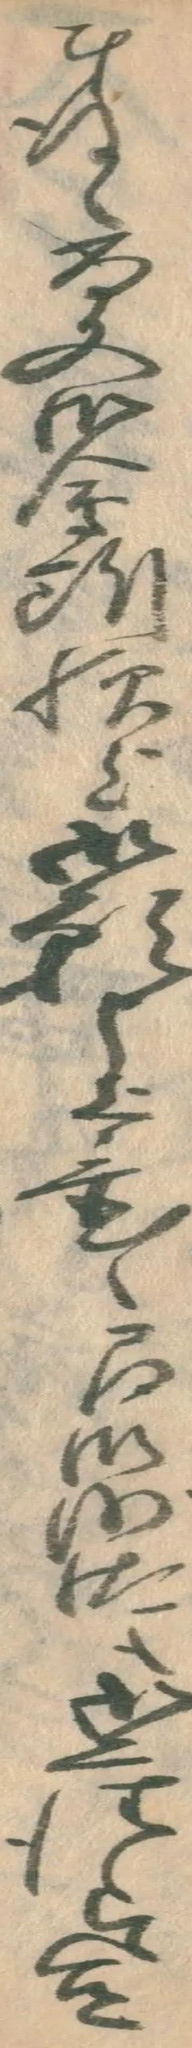奉存候尚又御会所様迄御願申上置候間御沙汰も御座候ハヽ宜
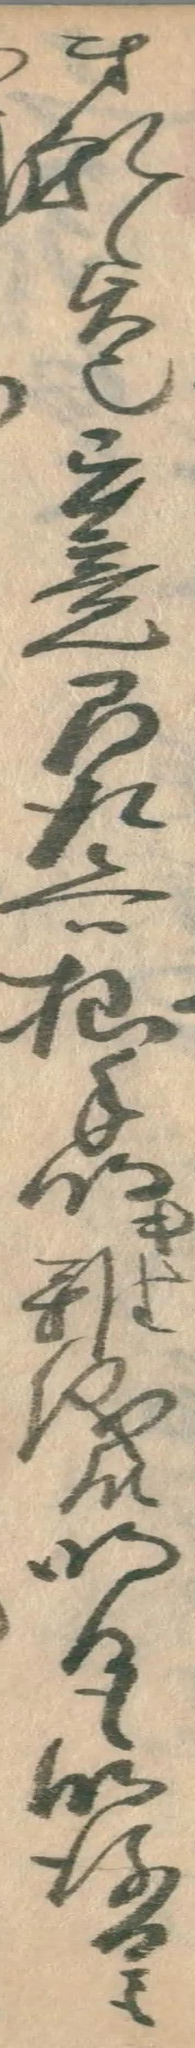奉願候旨也畢竟間取候へハ根手明キ難儀故明日も明後日ニも

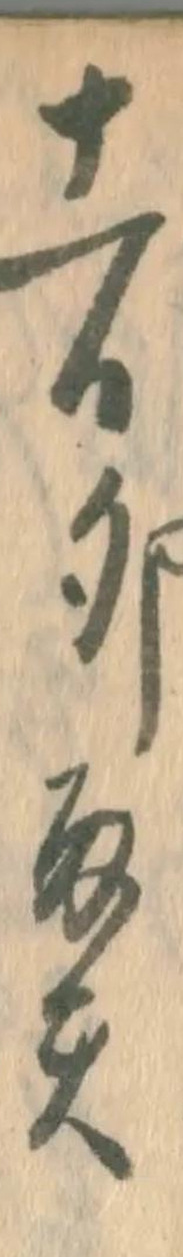十一日卯雨天
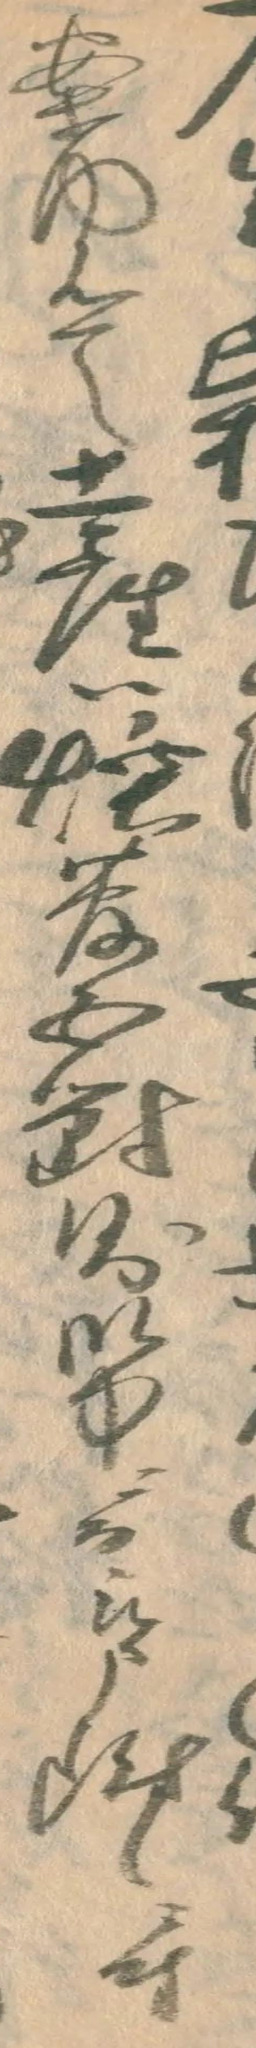案内有之土産ハ煙管五対則御中ニ而被申付候ニ付
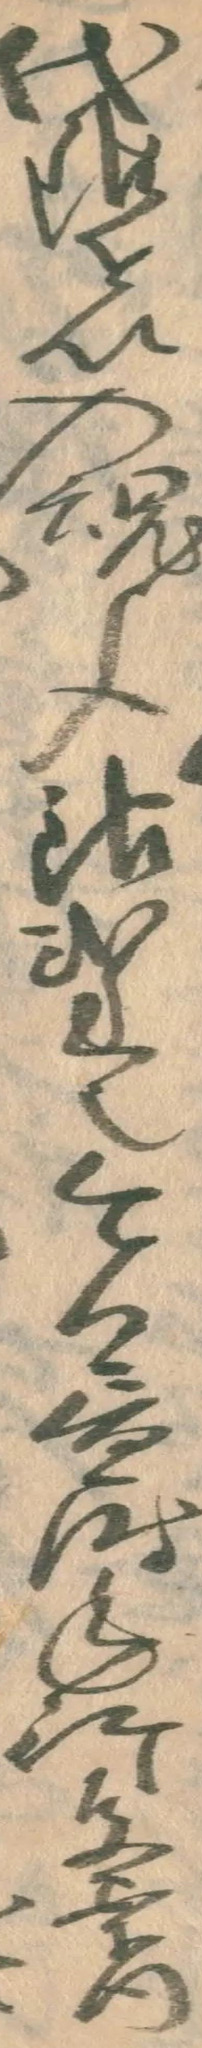代銀を以入魂申入銀弐匁也今日昼時年行事案内
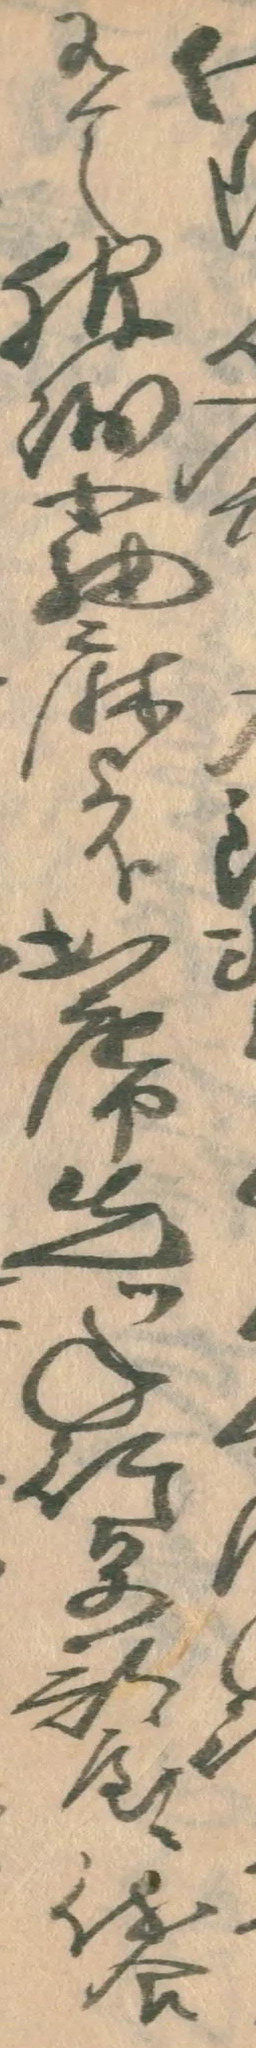有之服儀小袖麻上下出席先ツ年行事部屋ニ待合
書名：賀茂社記録. 第60冊
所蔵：国立国会図書館 National Diet Library, JAPAN
